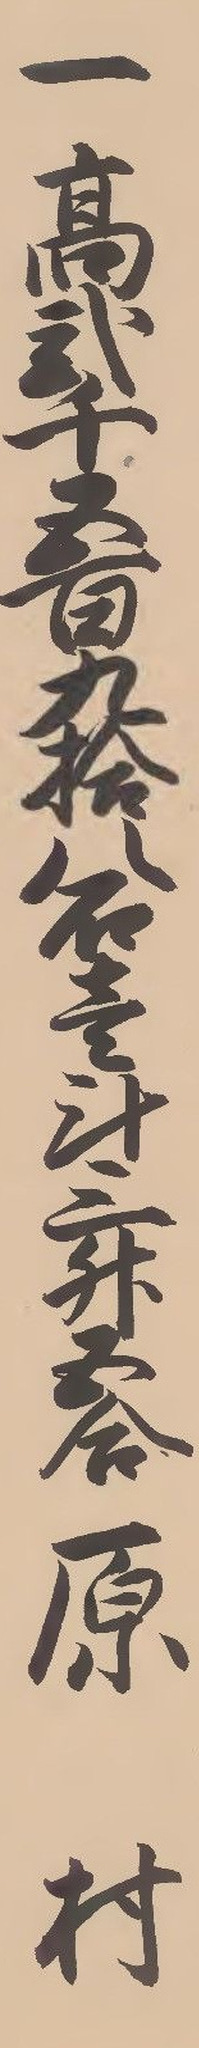一高弐千五百九拾八石壱斗三升五合原村
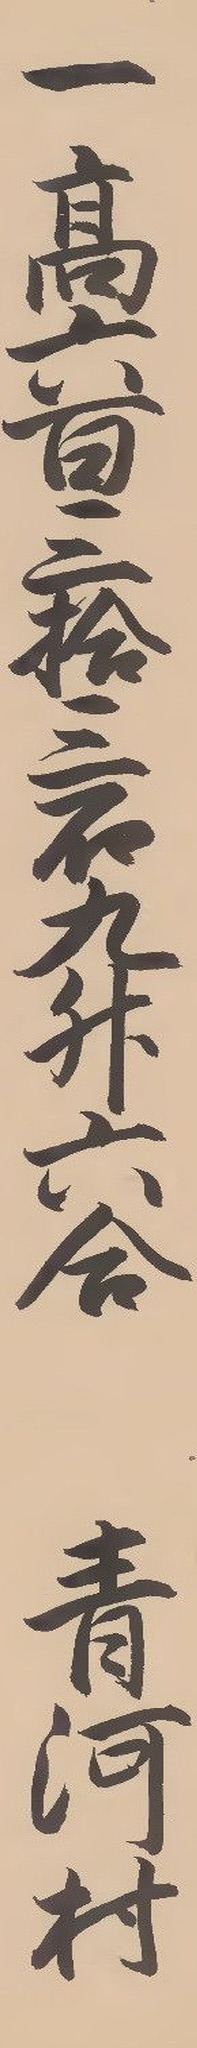一高六百三拾三石九升六合青河村
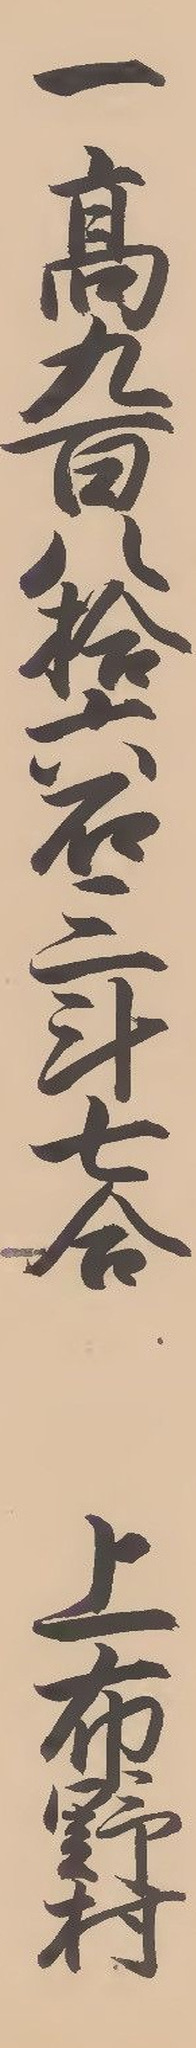一高九百八拾六石三斗七合上布野村

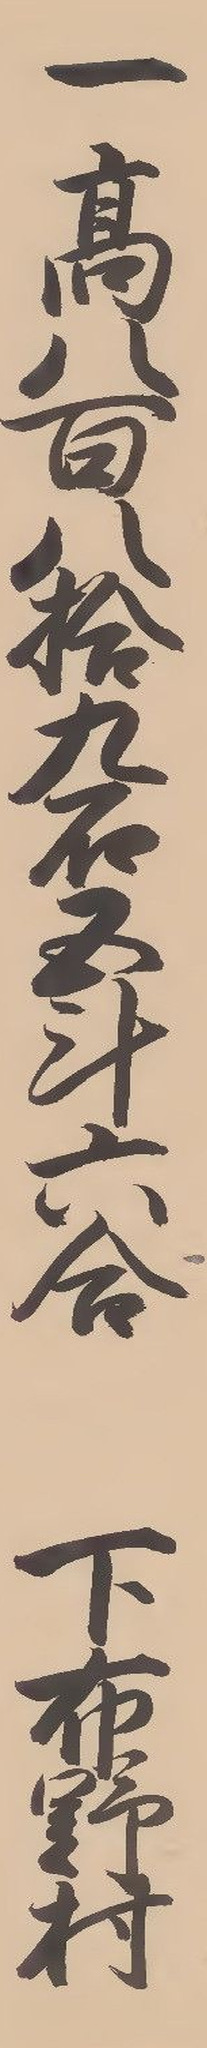一高八百八拾九石五斗六合下布野村
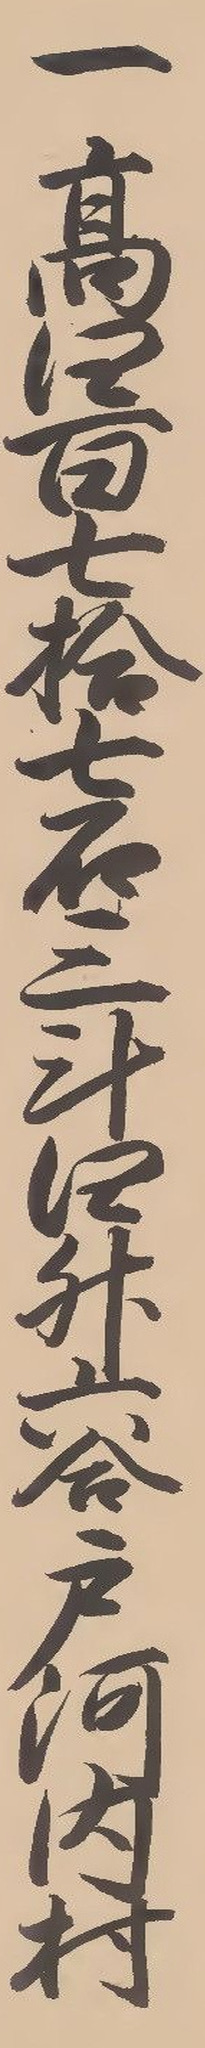一高四百七拾七石三斗四升六合戸河内村
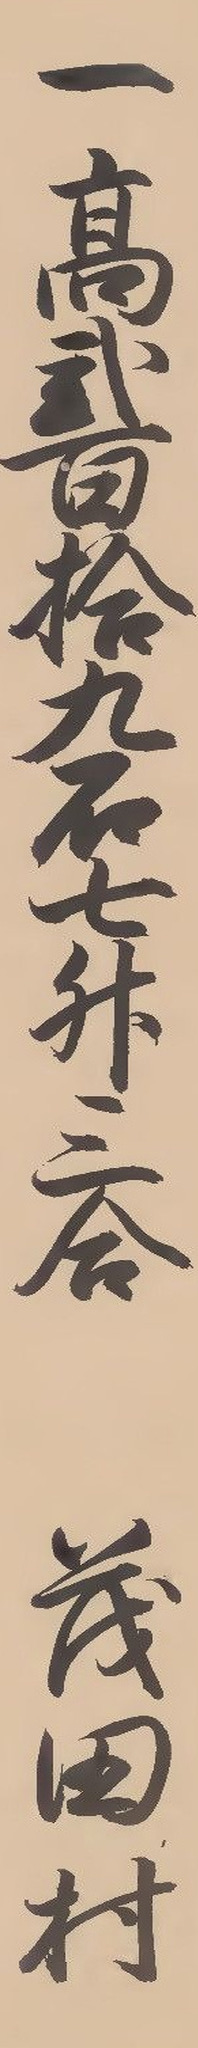一高弐百拾九石七升三合茂田村
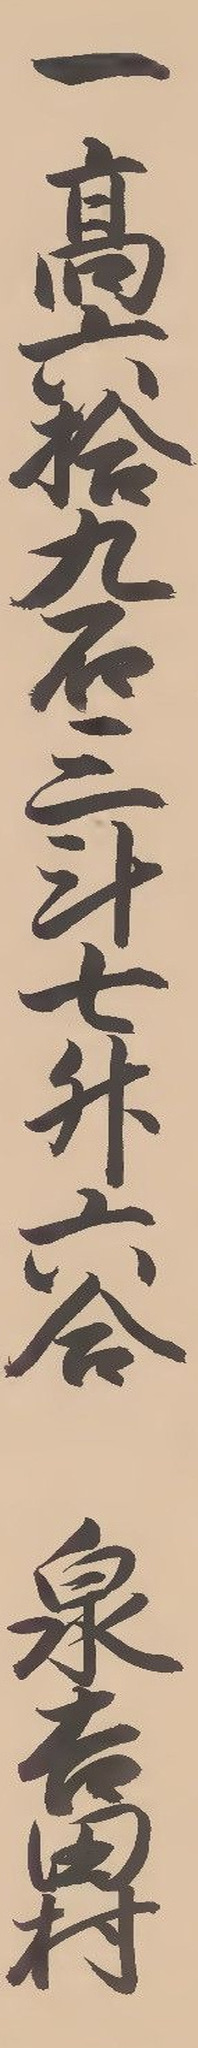一高六拾九石三斗七升六合泉吉田村
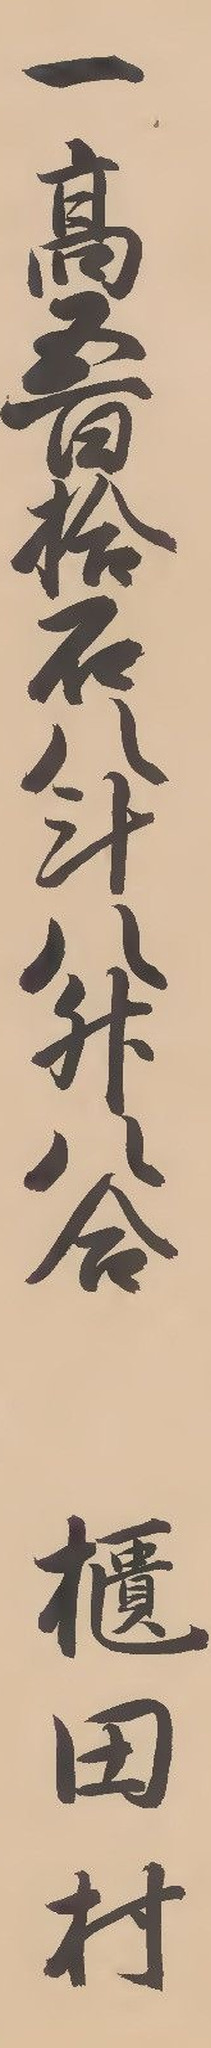一高五百拾石八斗八升八合櫃田村
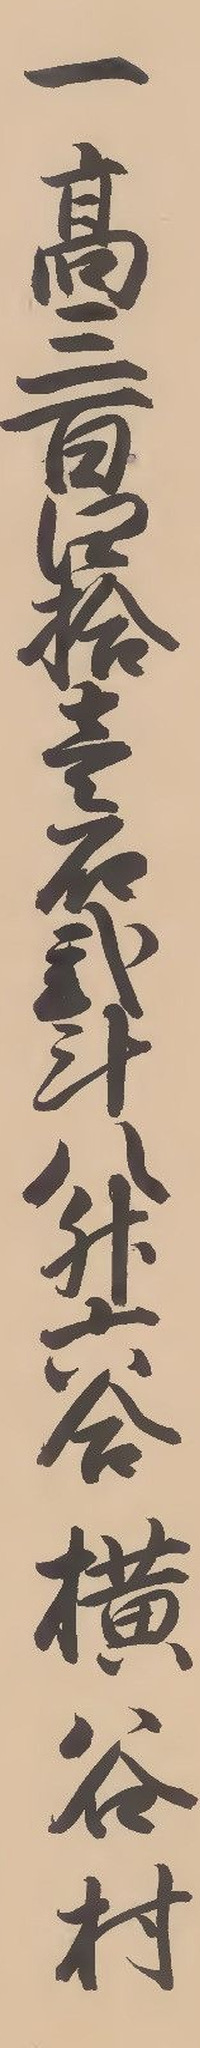一高三百四拾壱石弐斗八升六合横谷村
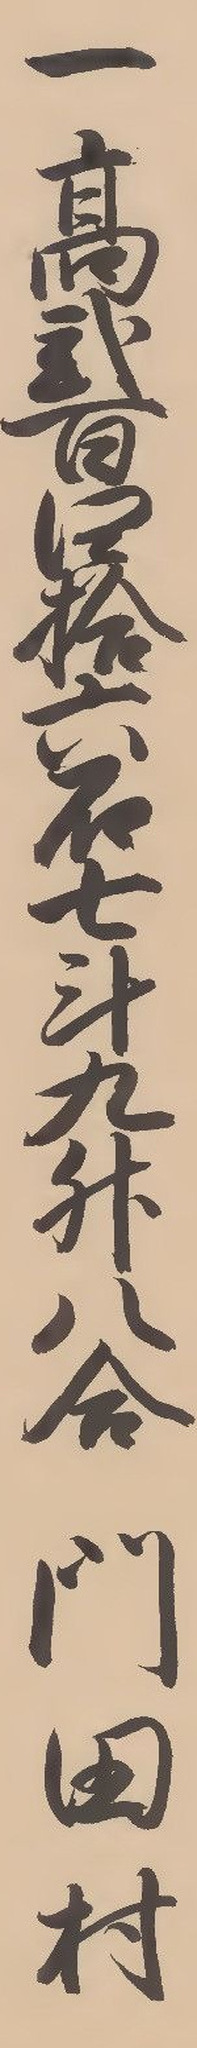一高弐百四拾六石七斗九升八合門田村
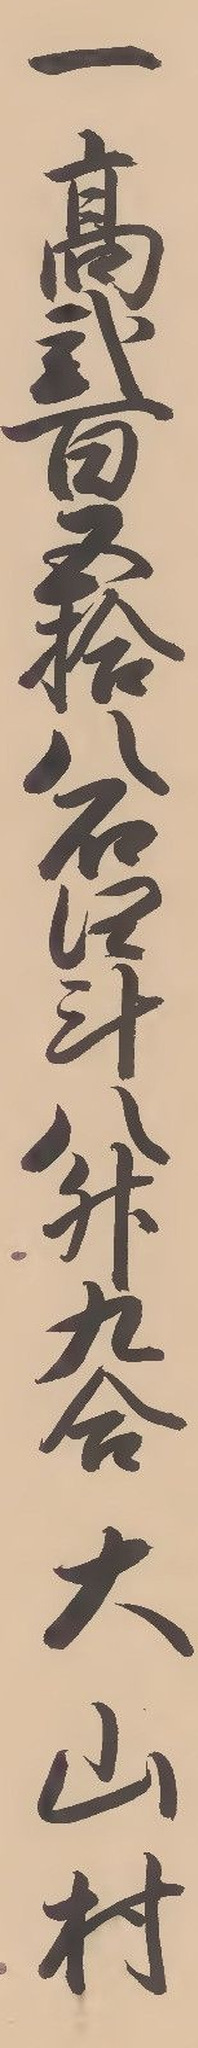一高弐百五拾八石四斗八升九合大山村

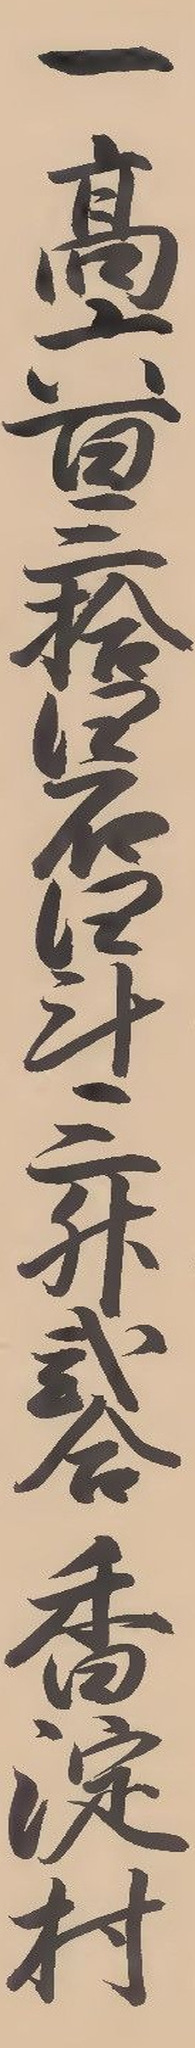一高六百三拾四石四斗三升弐合香淀村
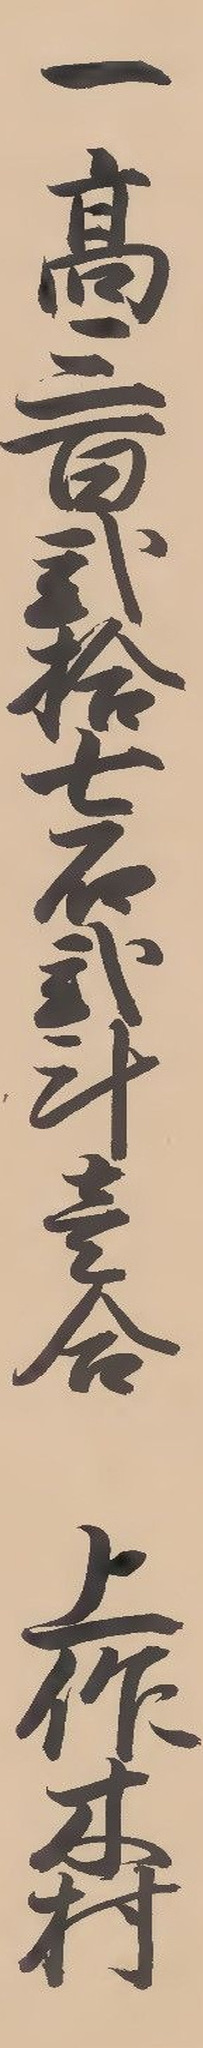一高三百弐拾七石弐斗壱合上作木村
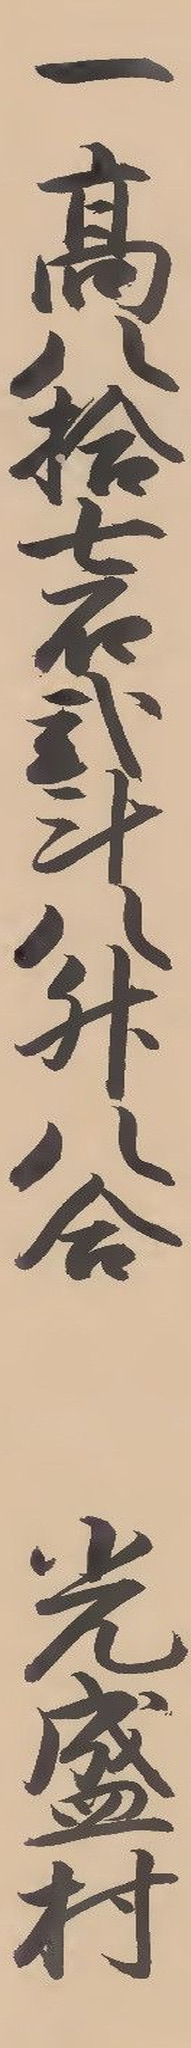一高八拾七石弐斗八升八合光盛村
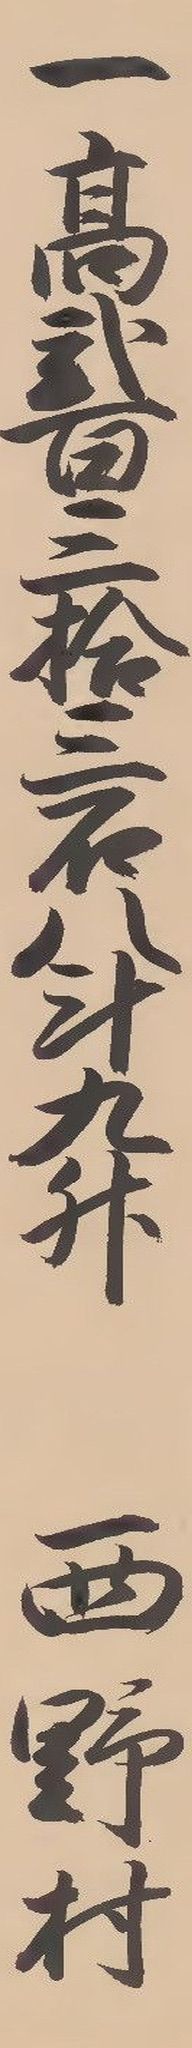一高弐百三拾三石八斗九升西野村
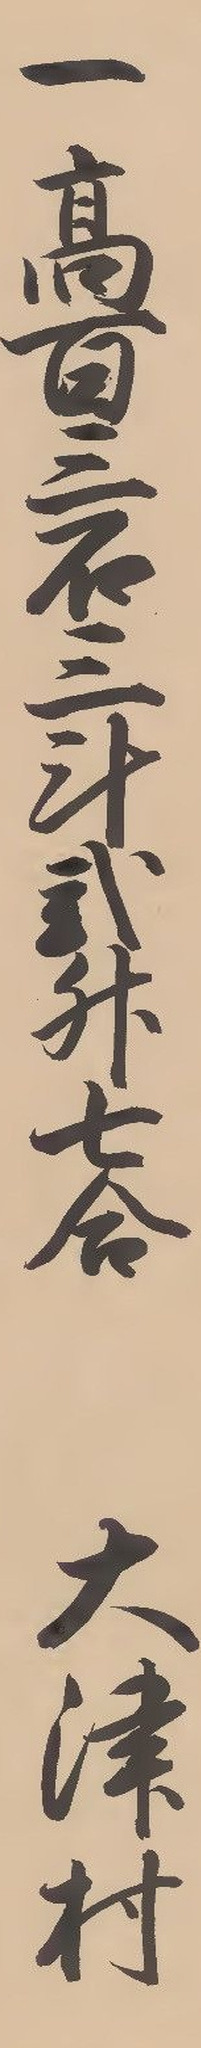一高百三石三斗弐升七合大津村
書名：備後国郷帳
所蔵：国立公文書館 National Archives of Japan
